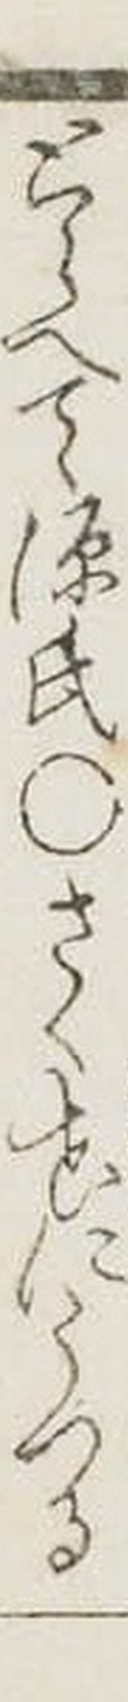とらへて源氏○さく花にうつる
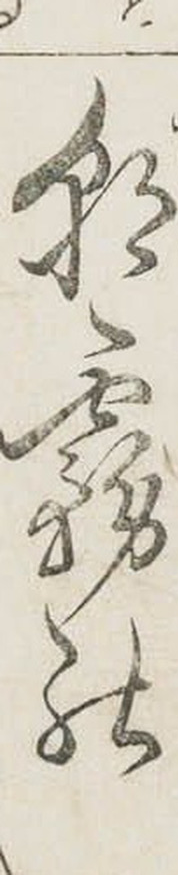朝霧の
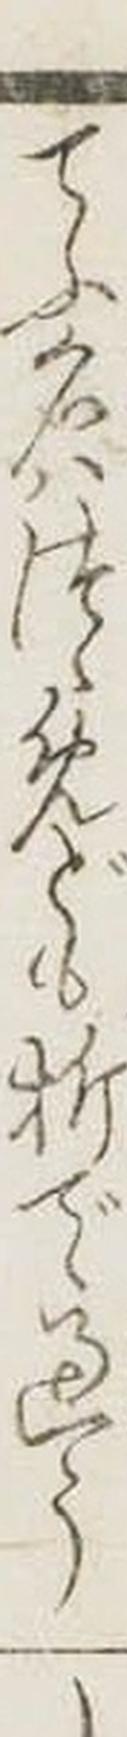てふ名はつゝめども折で過う
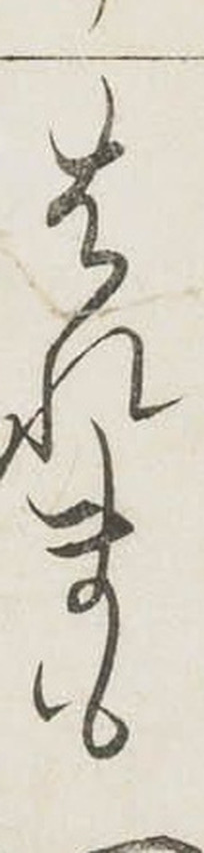はれまも
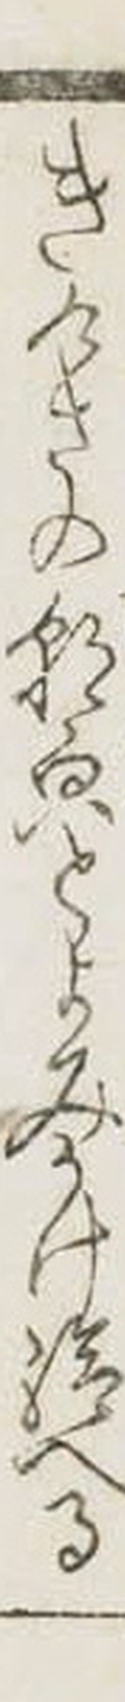きけさの朝皃とよみかけ給へる
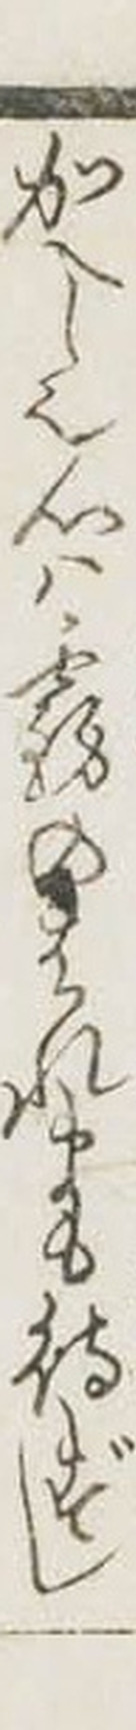かへし也心は霧のはれまも待ずし
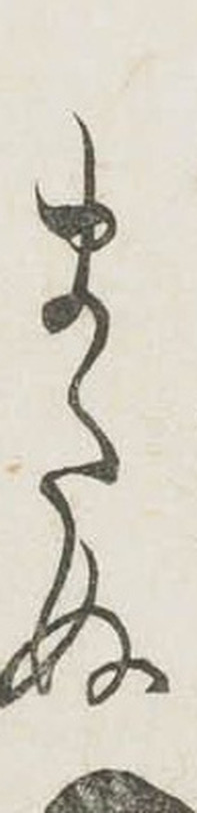またぬ
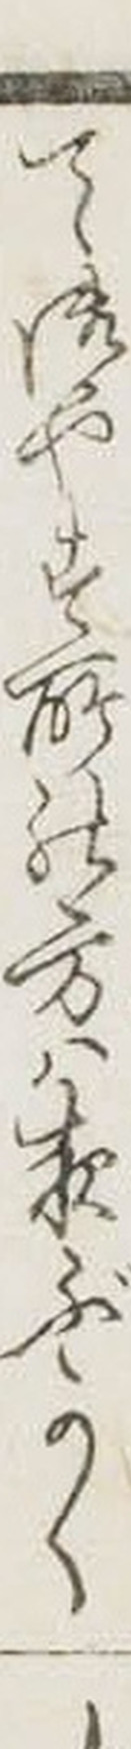て御やす所の方は夜ぶかく
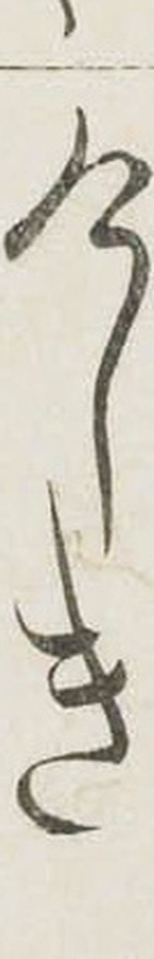けしき
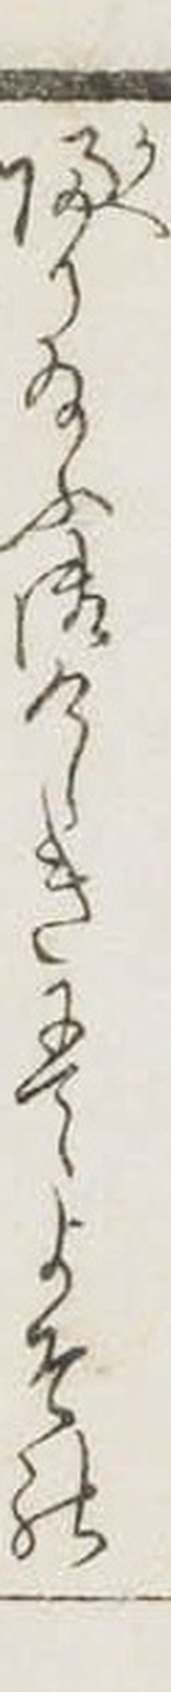帰り給ふ御けしきにてよその
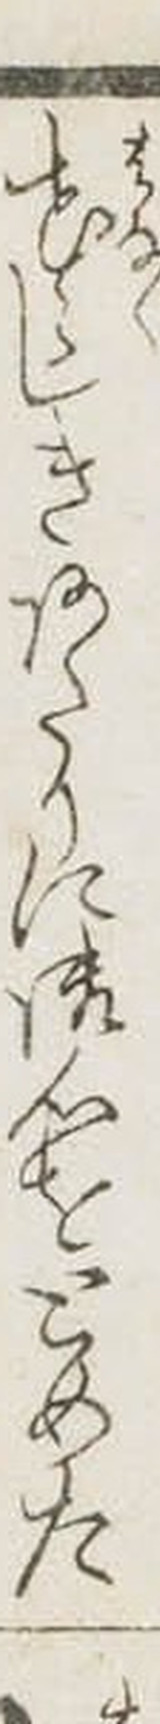花々しきあたりに御心をとめた
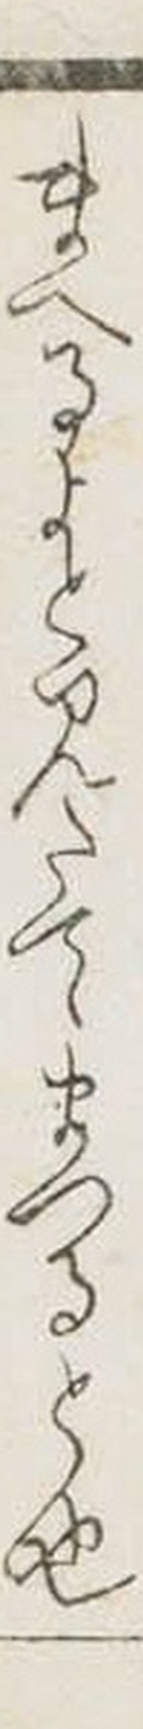まへるよと見たてまつると也
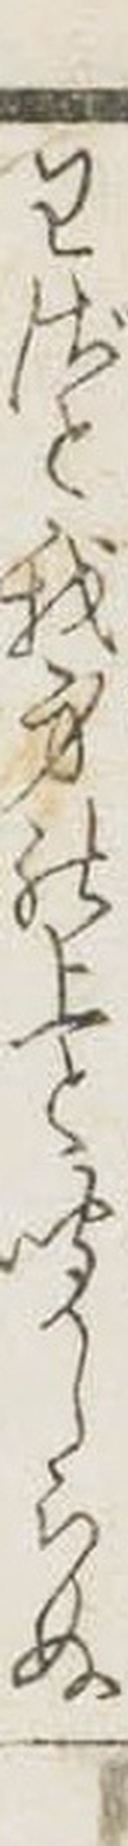わざと我身の上と聞しらぬ
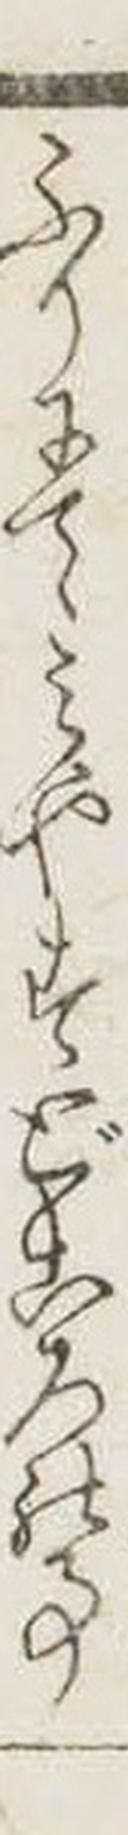ふりにてみやすどころの事
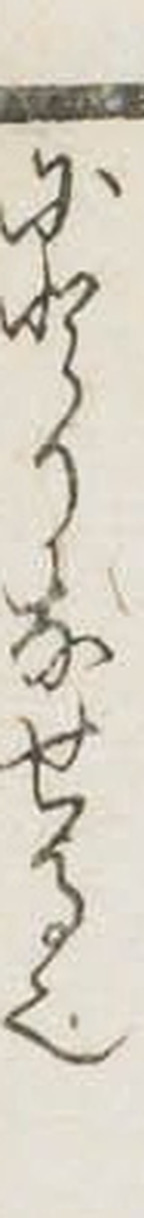にとりなせる也
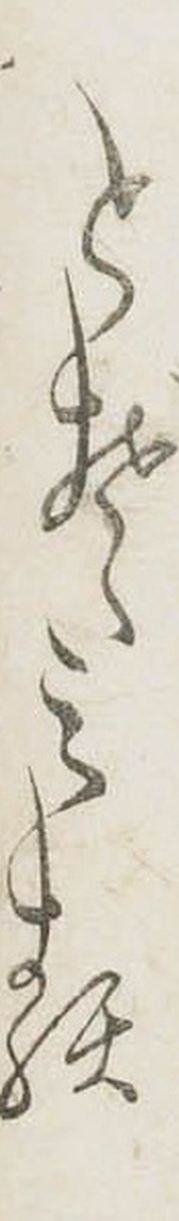とぞみる
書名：源氏百人一首
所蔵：東京学芸大学教育コンテンツアーカイブ
